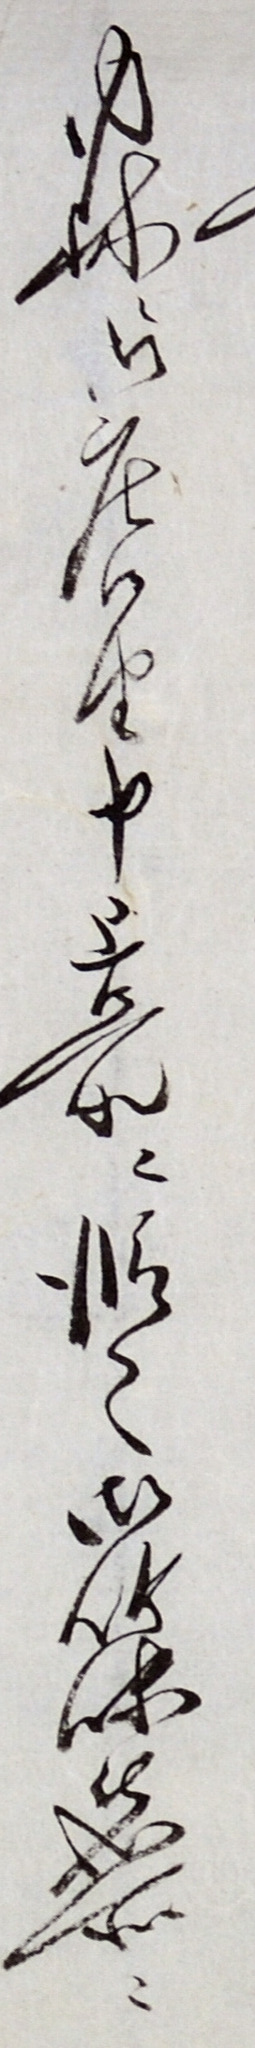内林ニ御座候由申上候所ニ段々御吟味被成所ニ
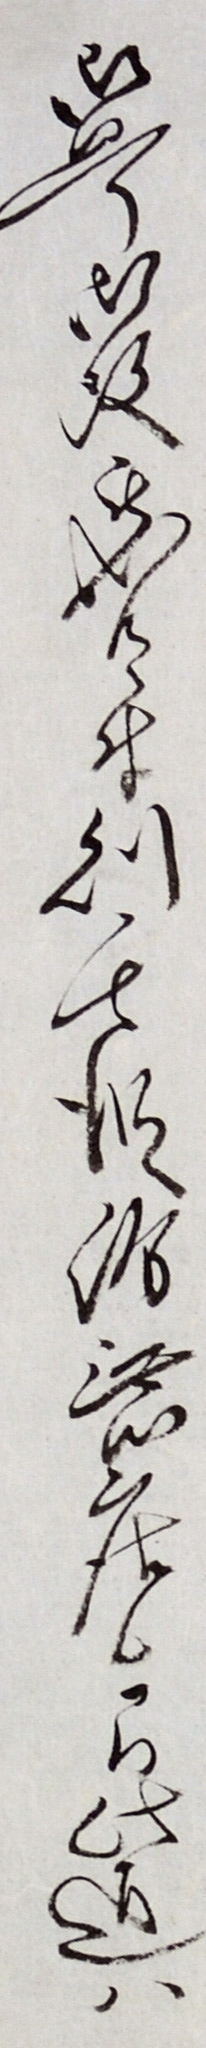御廻り御改被成候ニ付則其段紛無御座候間此通ハ
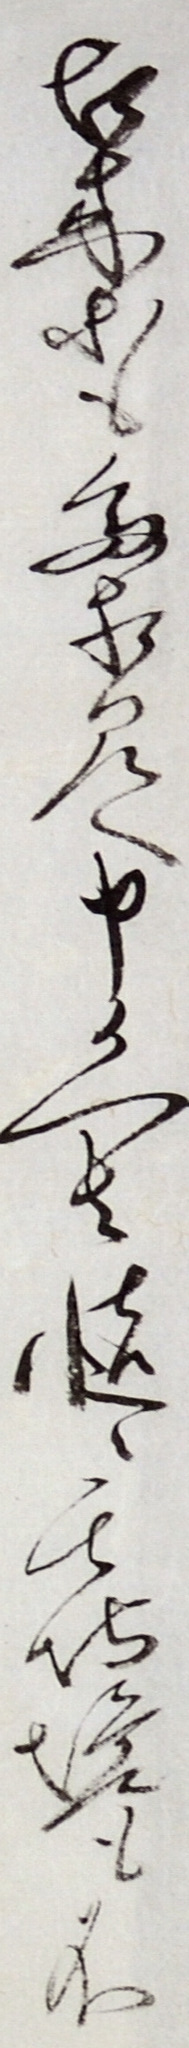古等も多相見へ申候へは慥ニ其持境も不

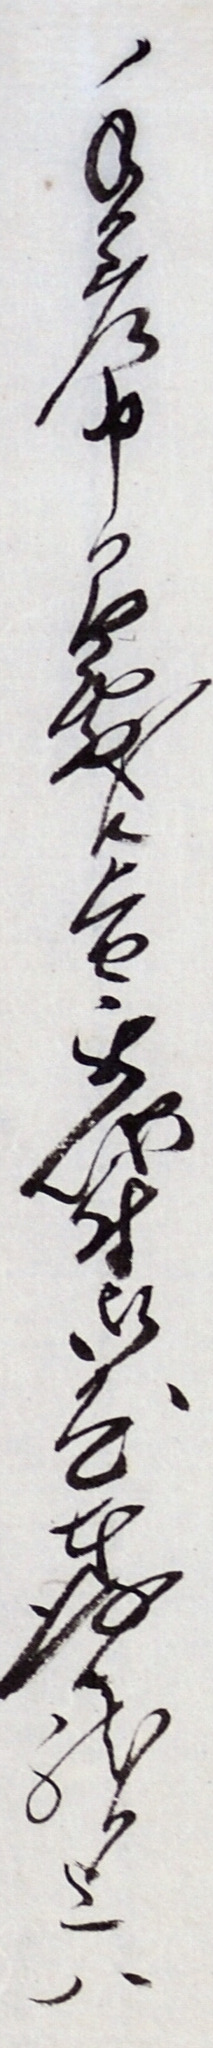手差申間敷候旨被仰付御尤奉存候然ル上ハ
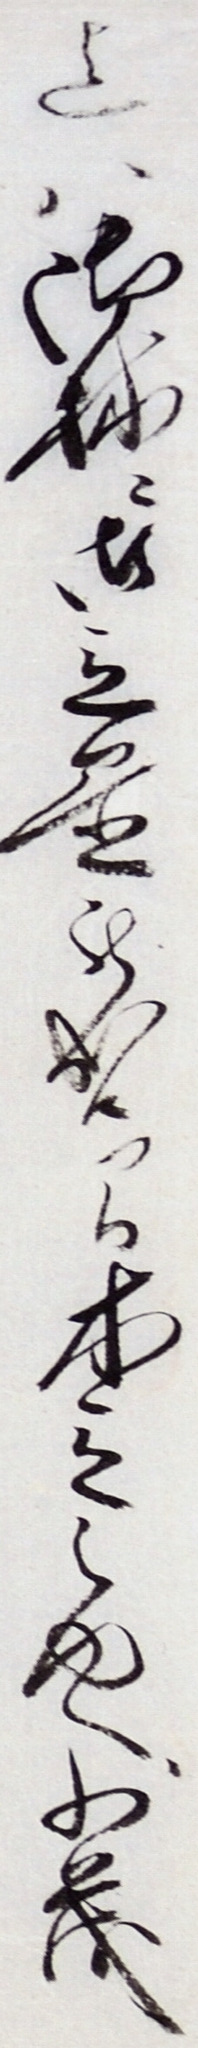迄ハ御林ニ御立置被成候間木立之内へ少も
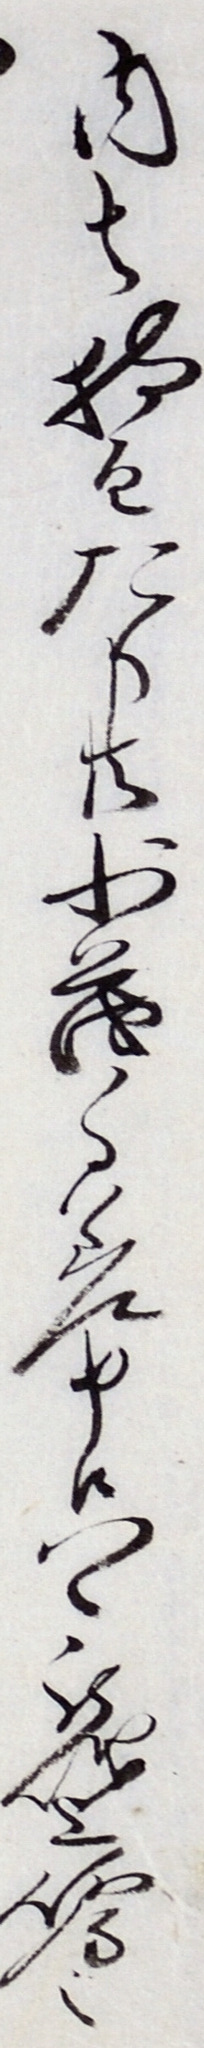内は持主たり共少も手差申候ハヽ被仰上何分之
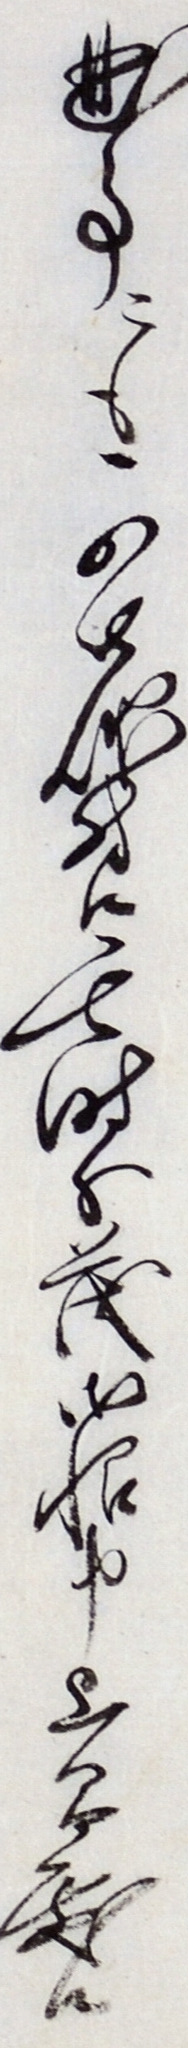曲事ニも可被仰付候其時分も御恨申上間敷候
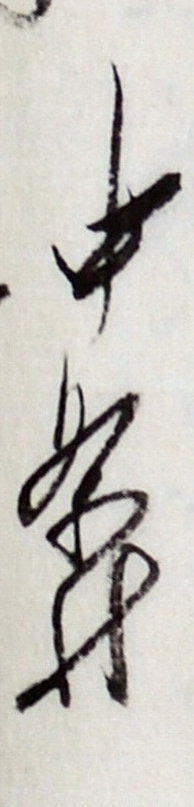中条村

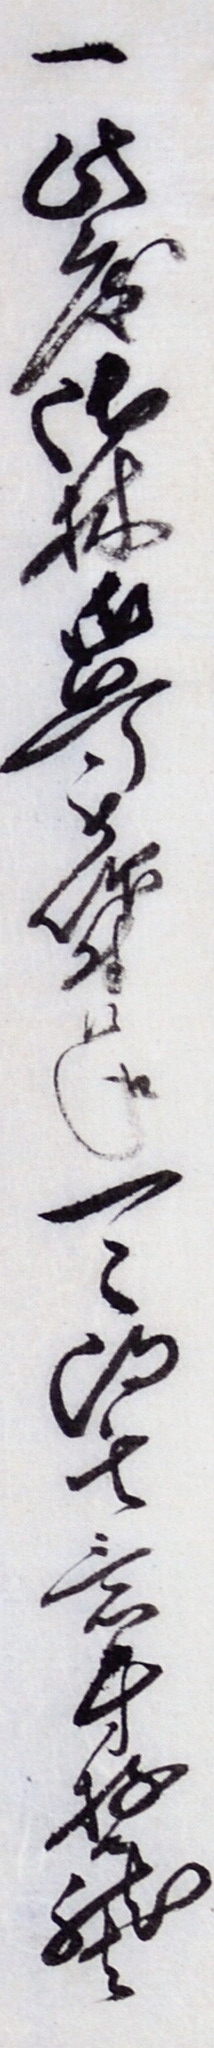一此度御林御廻り被仰付候趣一々得其意奉存候然は
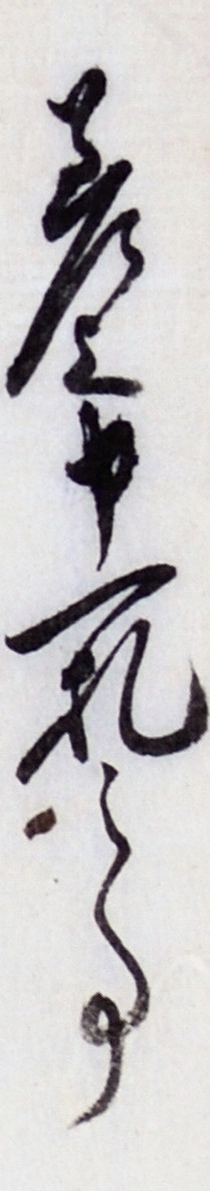差上申一札之事
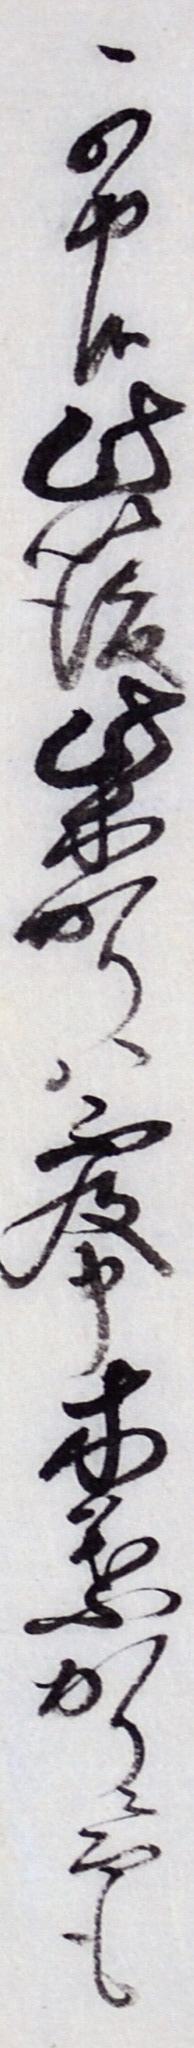可申候此以後柴かりハ不及申木葉かりニ而も
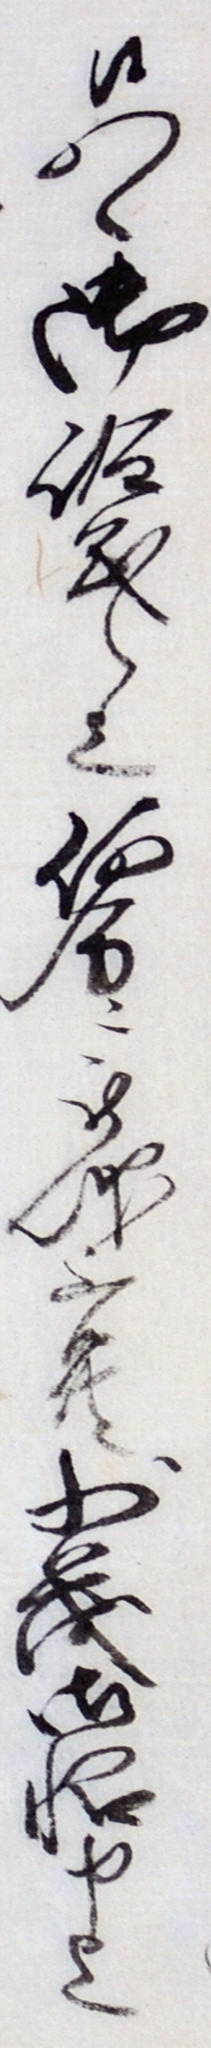候ハヽ御詮義之上何分ニ被仰上候共少も御恨申上
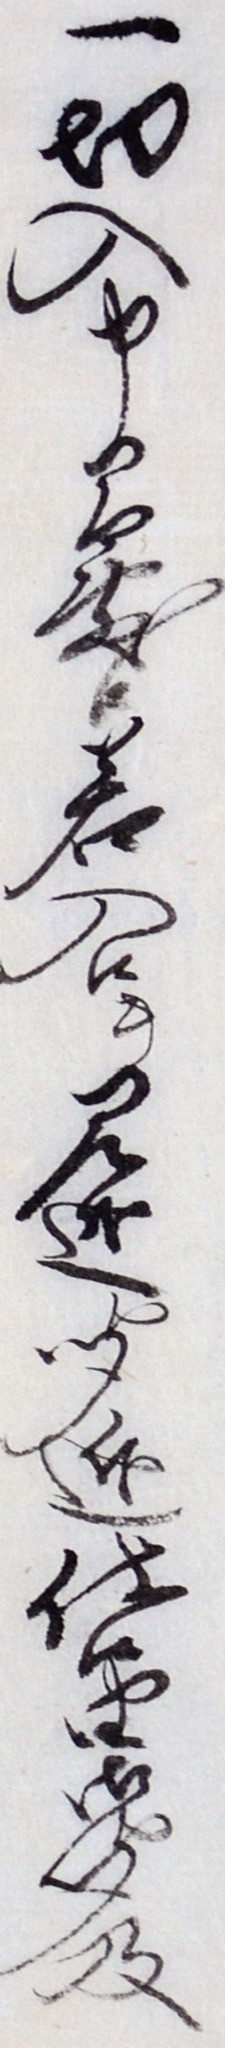一切入申間敷候若入候ヲ見逃聞逃仕候由御聞及
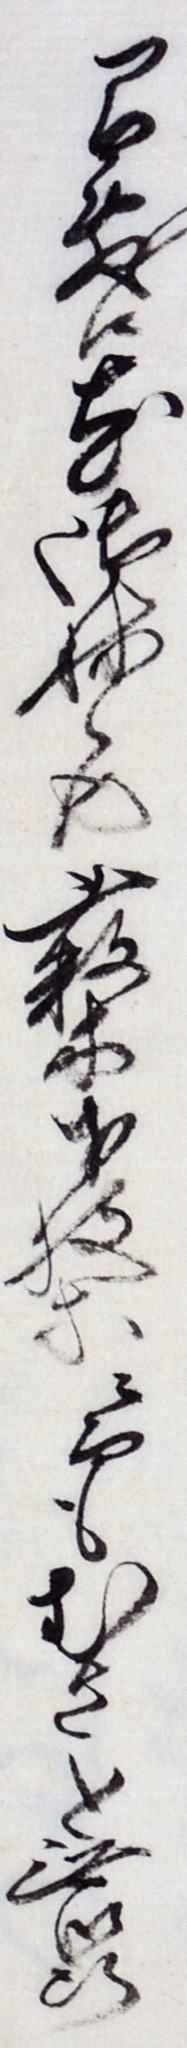間敷候尤御林之内薮木下枝等ニ而もむさと無御断
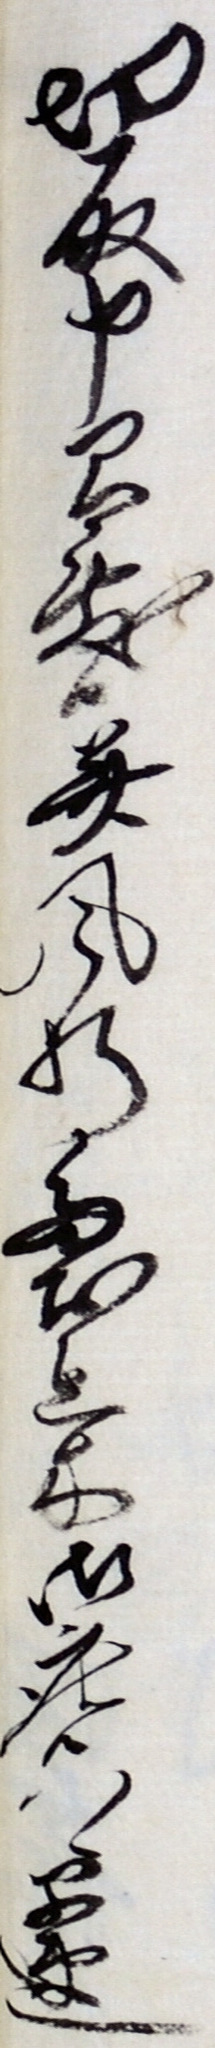切取申間敷候并風折たおれ木御座候ハヽ早速
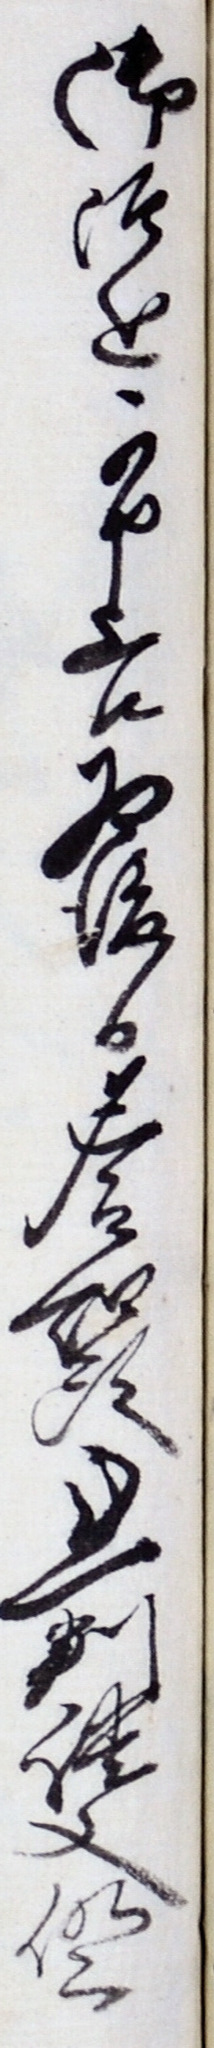御注進可申上候為後日名主組頭連判証文仍而
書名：御林御竹藪証文控
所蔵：伊那市立高遠町図書館・合同会社AMANE
